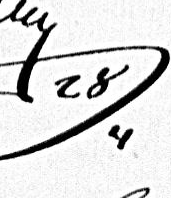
28xx
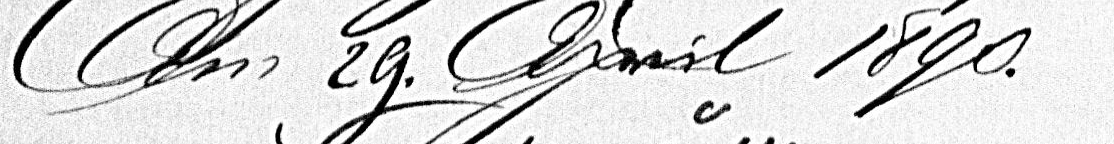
Am 29. April 1890.
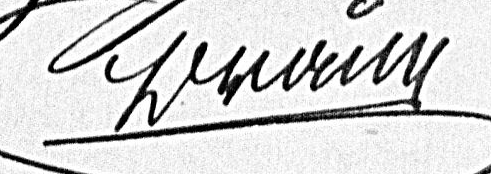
Braun
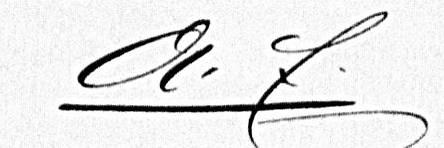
A. E.
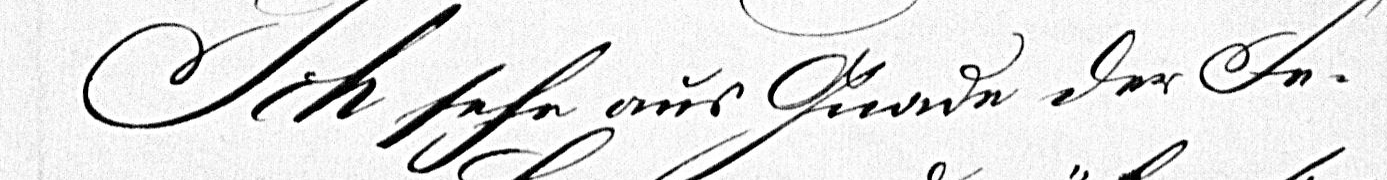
Ich sehn aus Gnade der Fe¬
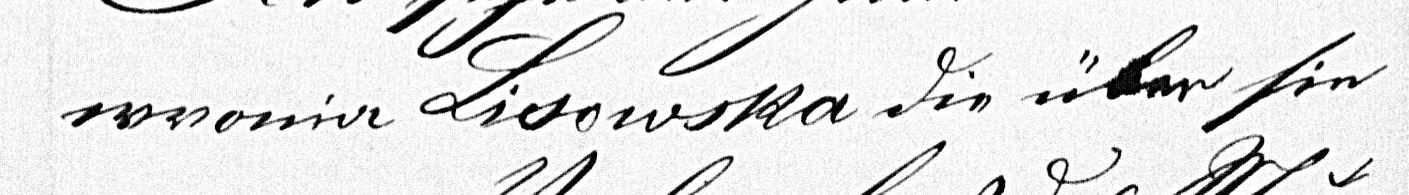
wronia Lisowska die über sie
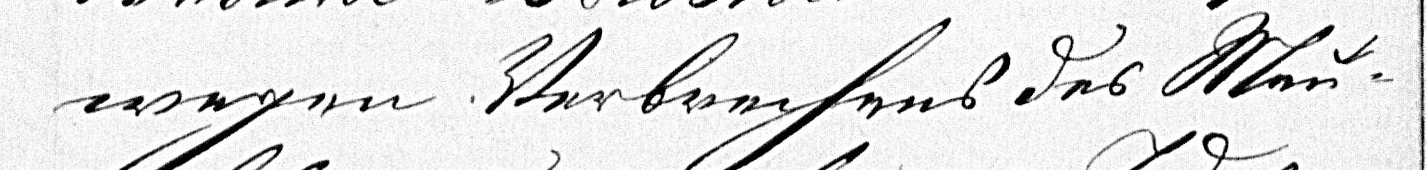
wegen Verbrechens des Meu¬
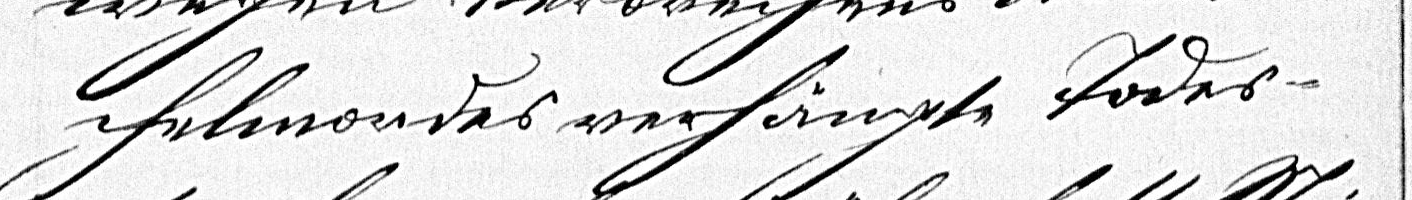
chelmordes verhängte Todes¬
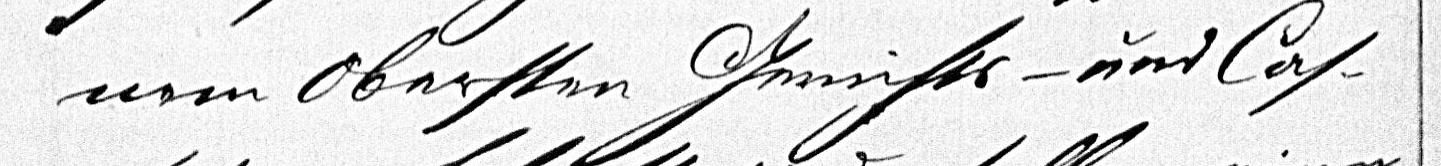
nem Obersten Gerichts - und Cas¬
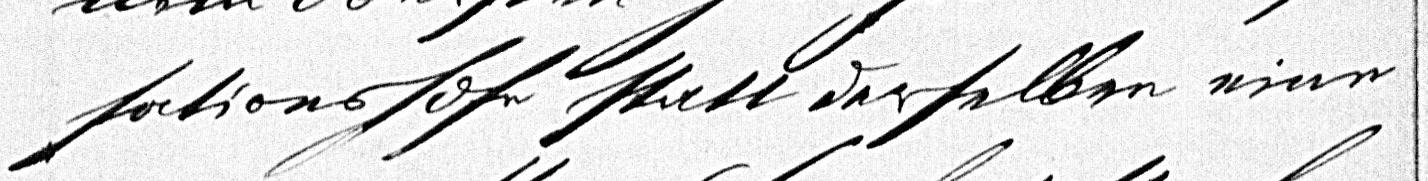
sationshofe statt derselben eine
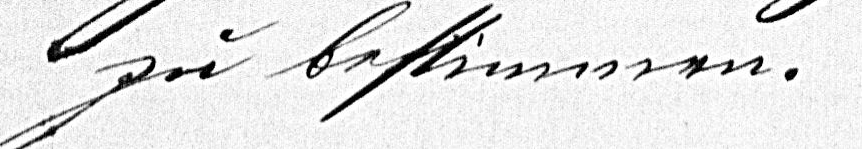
zu bestimmen.
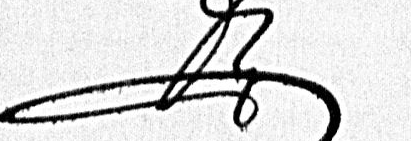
xx
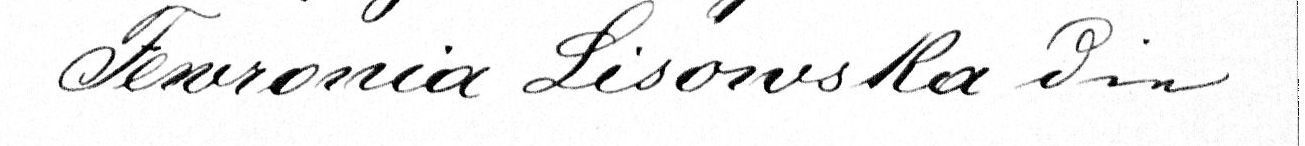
Fewronia Lisowska die
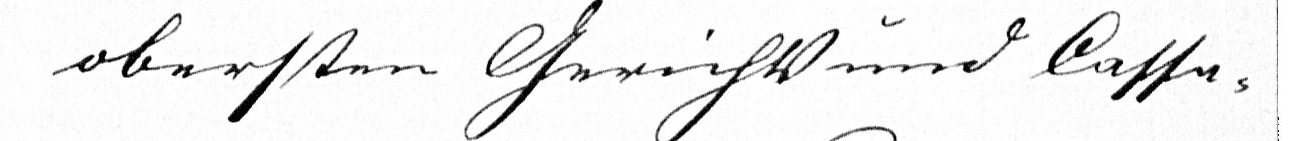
obersten Gericht und Cassa¬
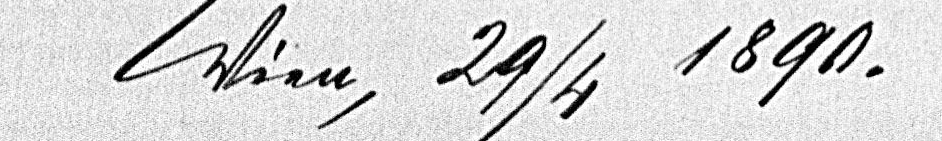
Wien, 29/4 1890.
